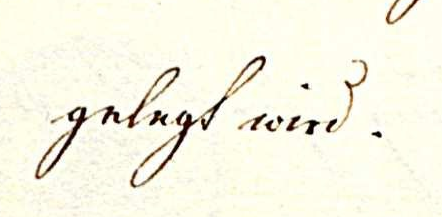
gelegt wird.
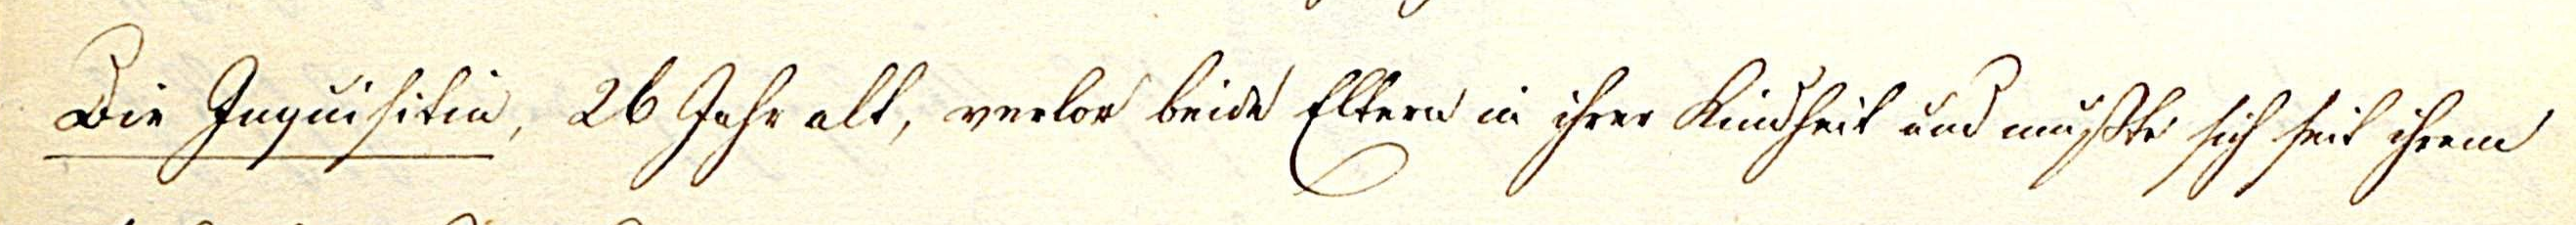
Die Inquisitin, 26 Jahr alt, verlor beide Eltern in ihrer Kindheit und mußte sich seit ihrem
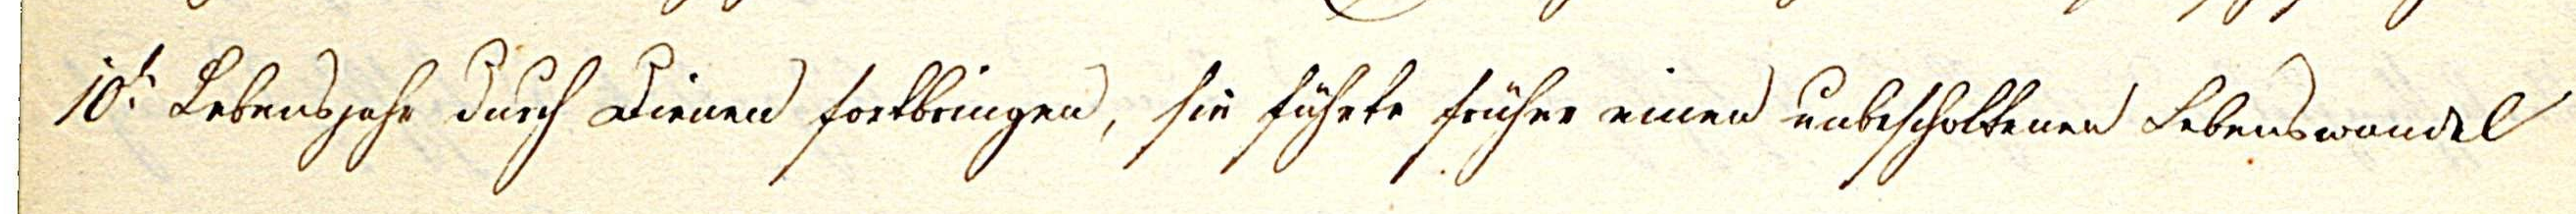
10. Lebensjahr durch Dienen fortbringen, sie führte früher einen unbescholtenen Lebenswandel
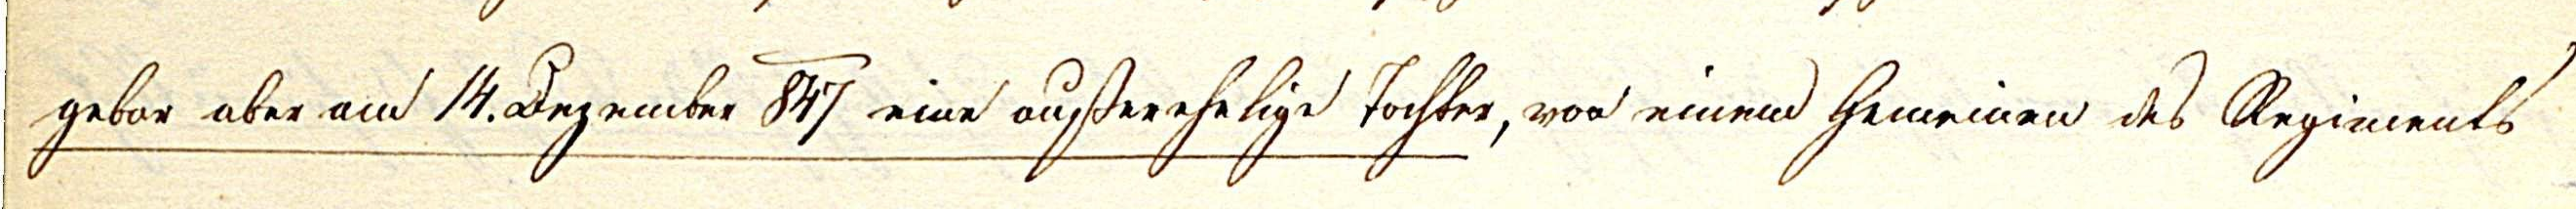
gebar aber am 14. Dezember 847 eine außereheliche Tochter, vom einem Gemeinen des Regiments
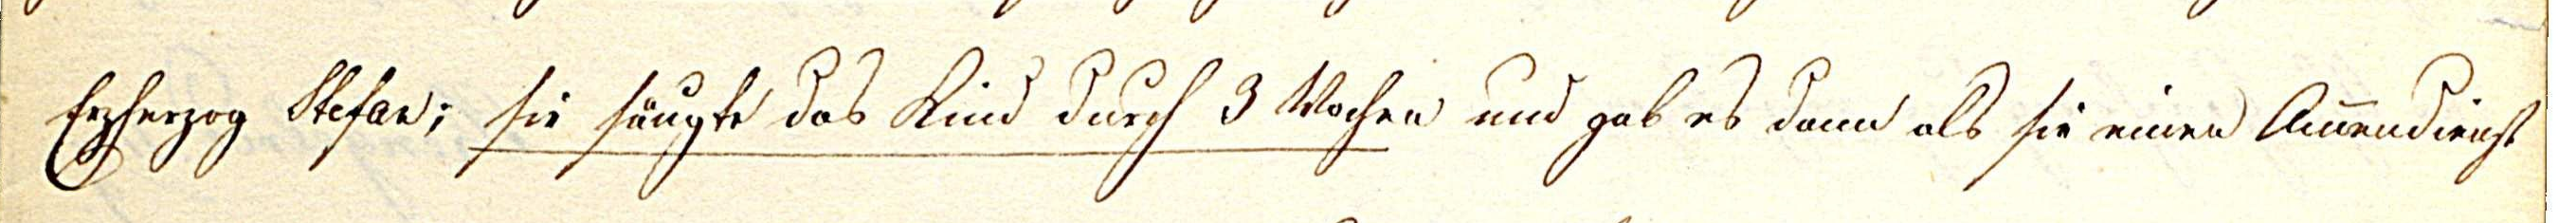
Erzherzog Stefan; sie säugte das Kind durch 3 Wochen und gab es dann als sie einen Ammendienst
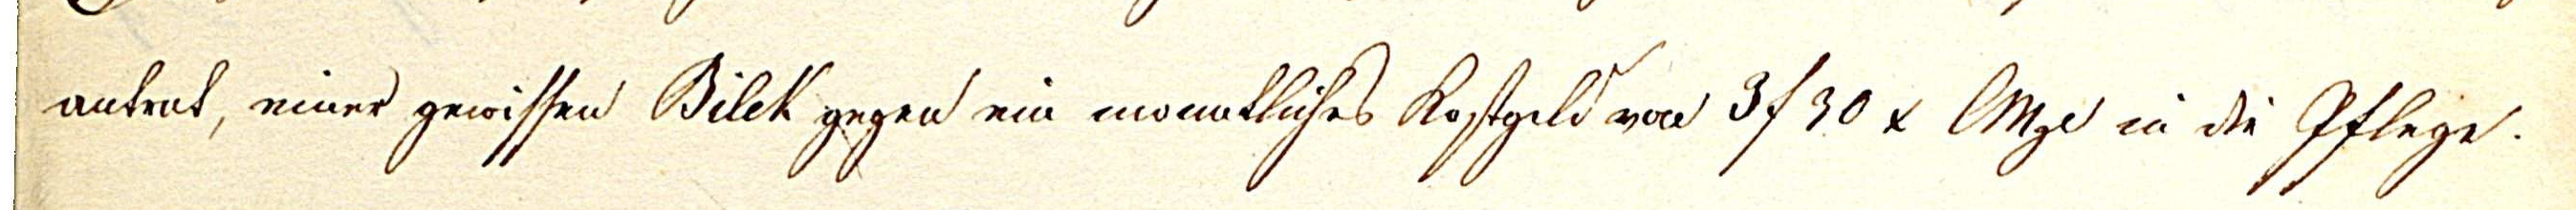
antrat, einer gewissen Bilek gegen ein monatliches Kostgeld von 3f30x CMze in die Pflege.
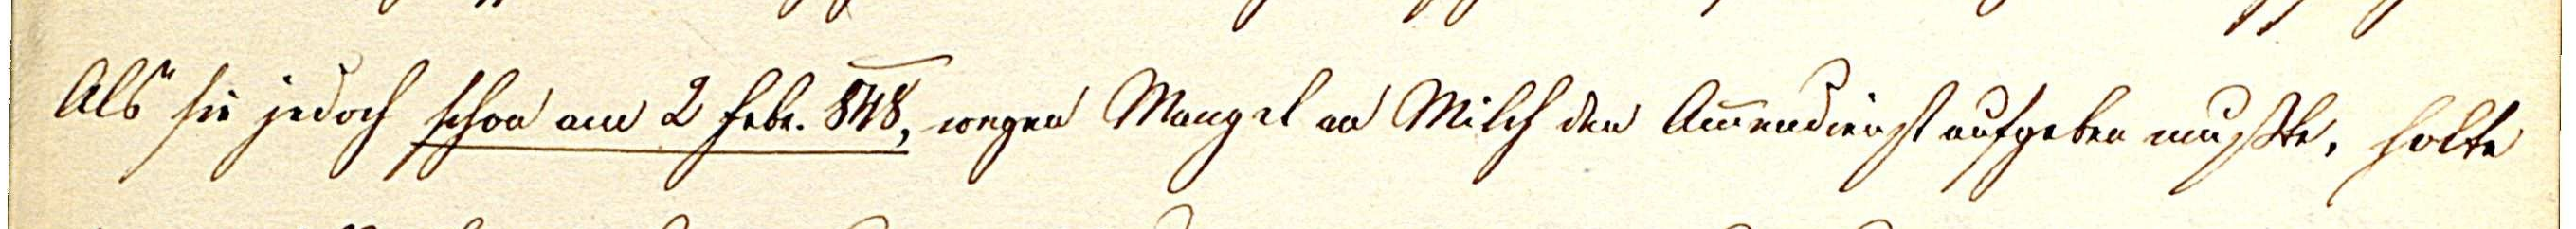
Als sie jedoch schon am 2 Febr 848, wegen Mangel an Milch den Ammendienst aufgeben mußte, holte
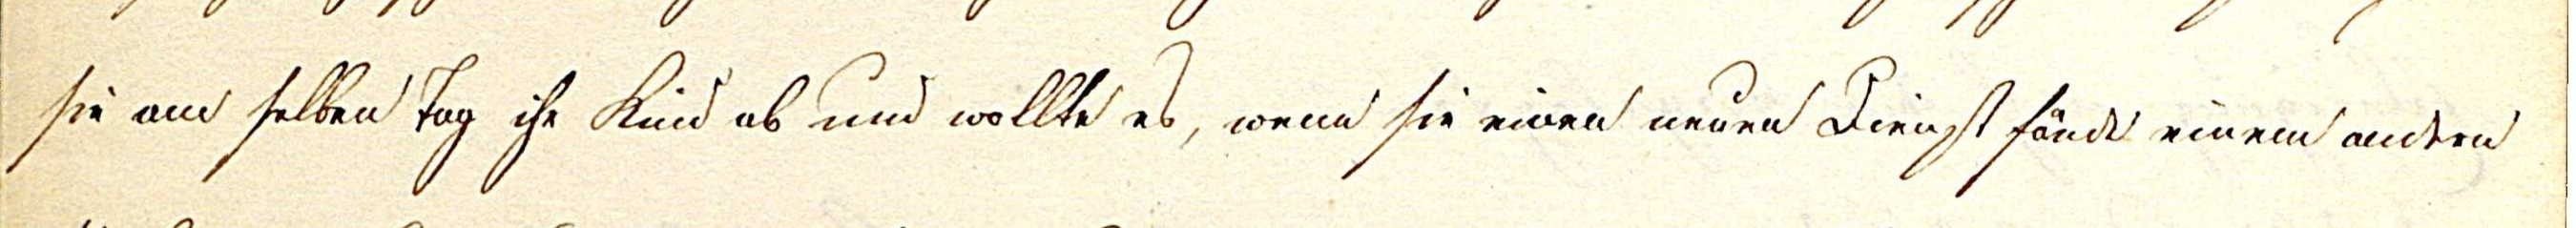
sie am selben Tag ihr Kind ab und wollte es, wenn sie einen neuern Dienst fände einen anderen
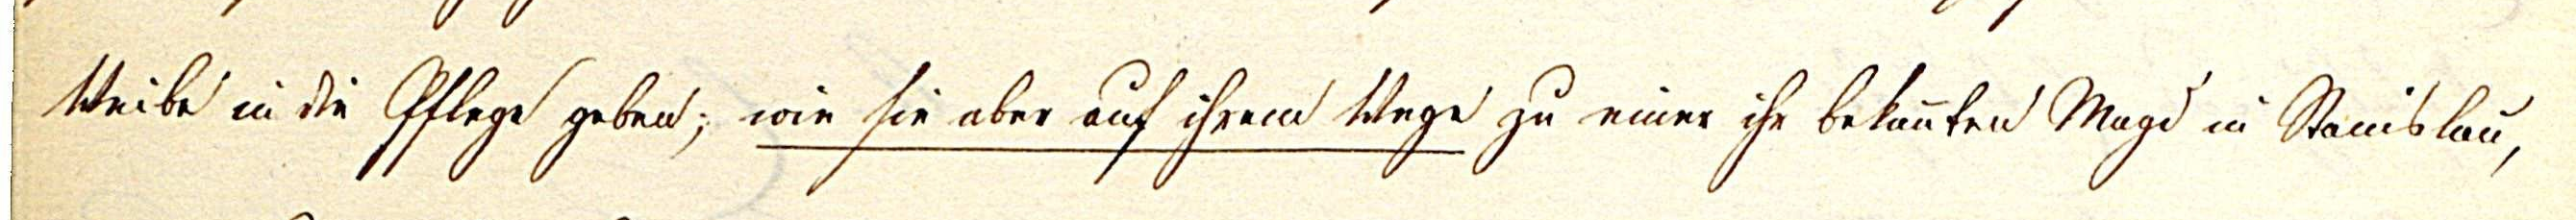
Weibe in die Pflege geben; wie sie aber auf ihrem Wege zu einer ihr bekannten Magd in Stanislau,
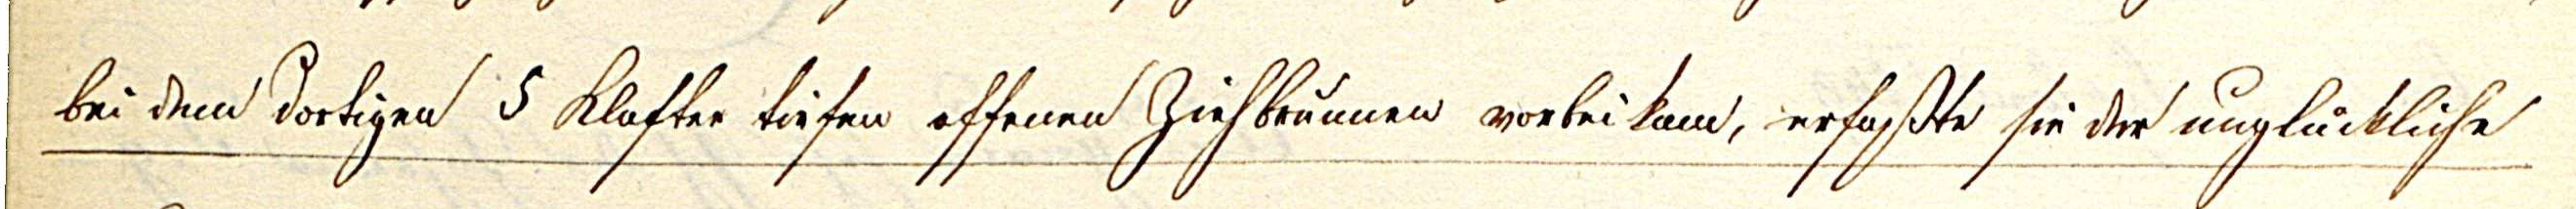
bei dem dortigen 5 Klafter tiefen offenen Ziehbrunnen vorbeikam, erfaßte sie der unglückliche
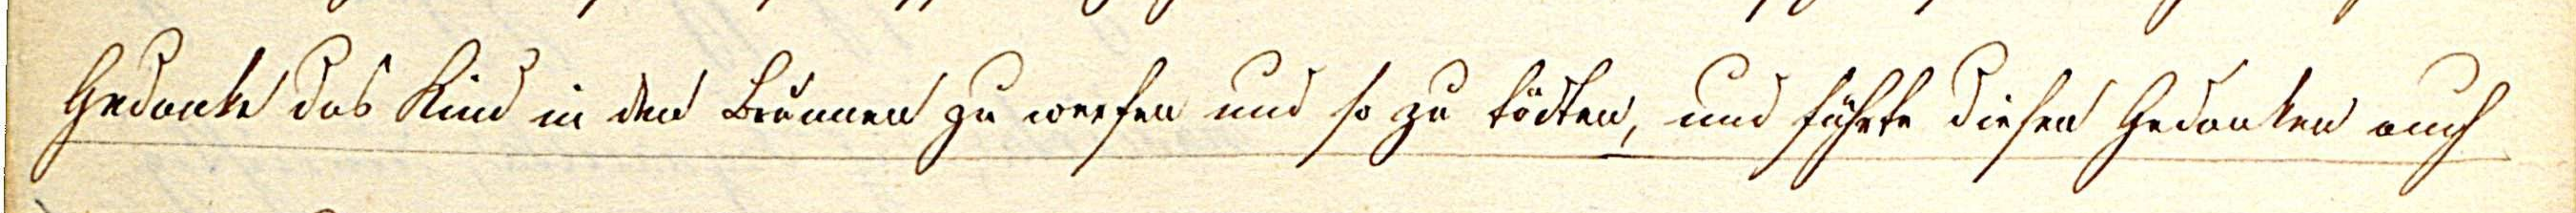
Gedanke das Kind in den Brunnen zu werfen und so zu tödten, und führte diesen Gedanken auch
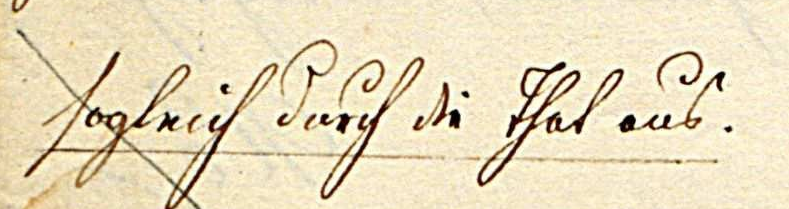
sogleich durch die That aus.
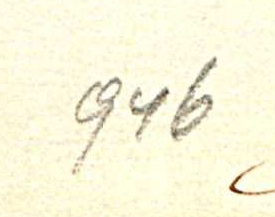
916
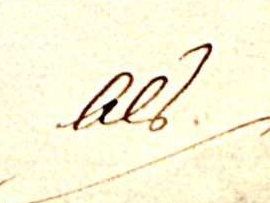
als
